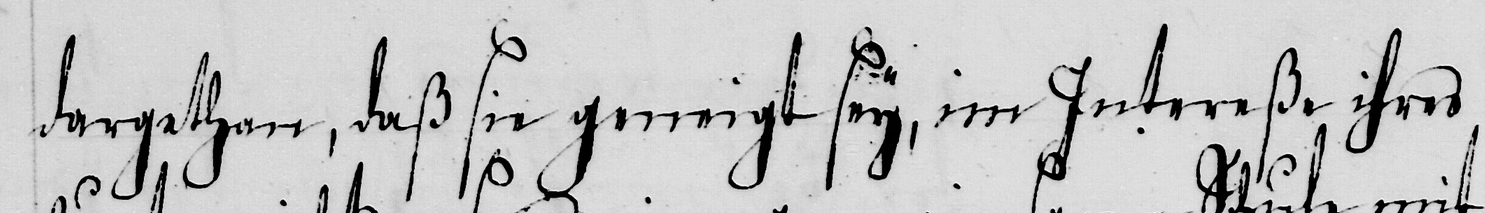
dargethan, daß sie geneigt sey, im Intereße ihres
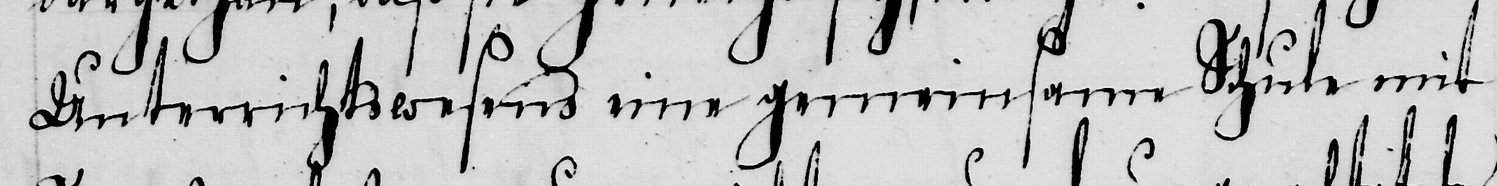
Unterrichtswesens eine gemeinsame Schule mit
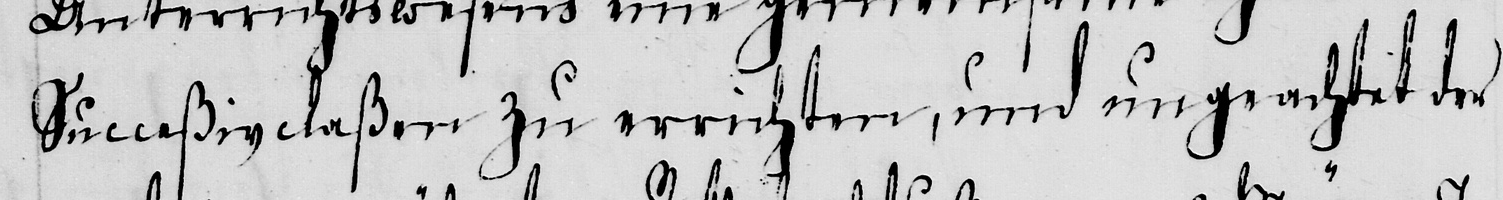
Succeßivclaßen zu errichten, und ungeachtet der
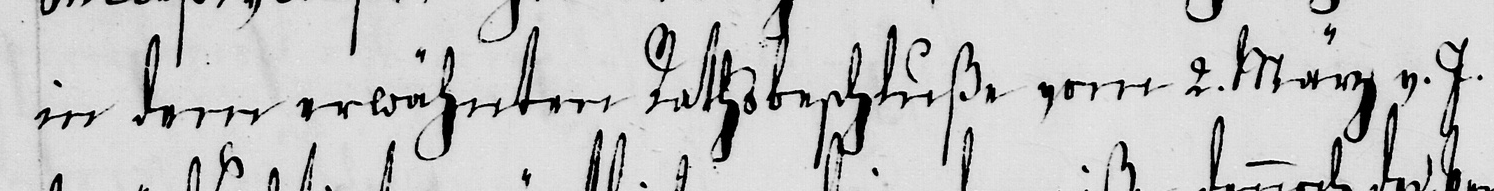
in dem erwähnten Rathsbeschluße vom 2. März v.
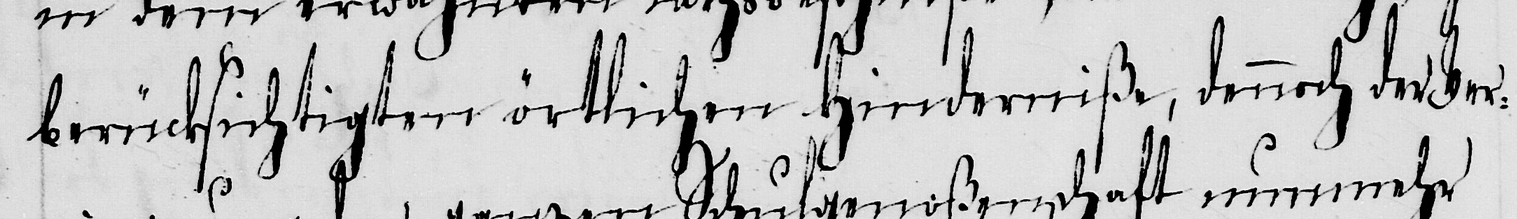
berücksichtigten örtlichen Hinderniße, dennoch der Ve¬
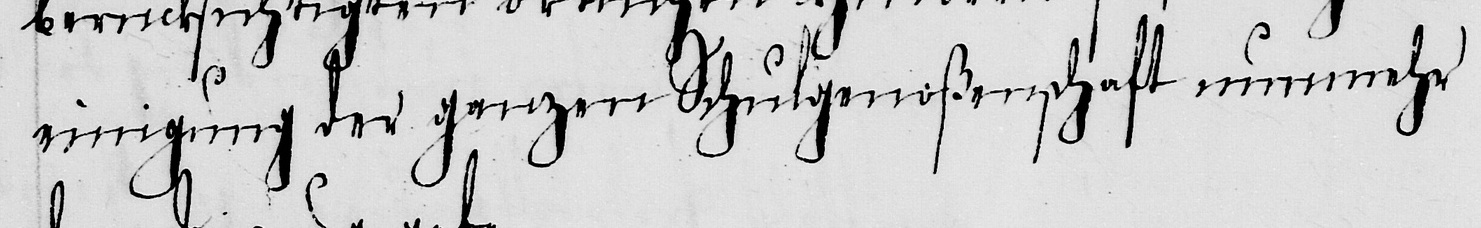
reinigung der ganzen Schulgenoßenschaft nunmehr
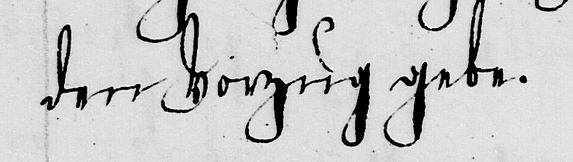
den Vorzug gebe.
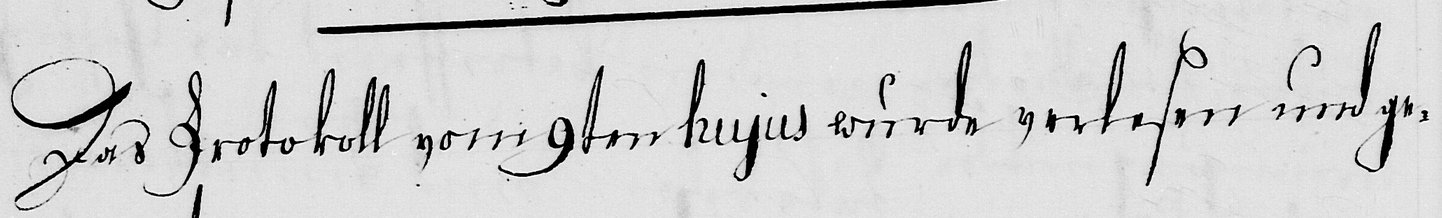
Das Protokoll vom 9ten hujus wurde verlesen und ge¬
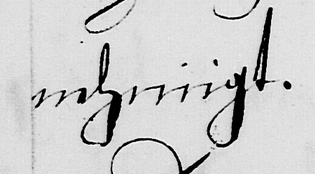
nehmigt.
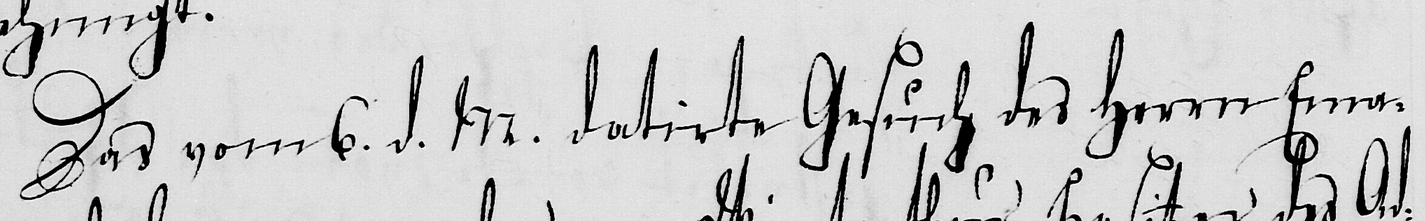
Das vom 6. d. M. datirte Gesuch des Herrn Ema¬
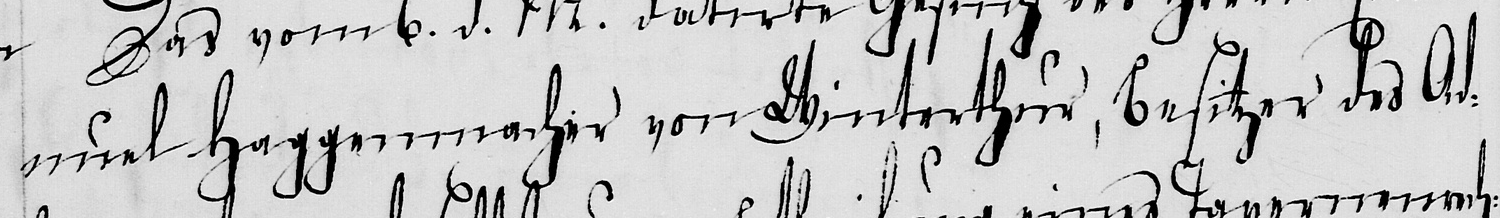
nuel Haggenmacher von Winterthur, Besitzer des Ad¬
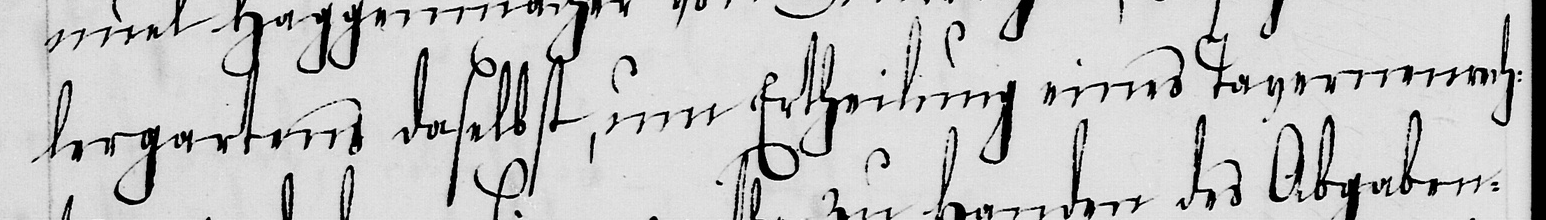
lergartens daselbst, um Ertheilung eines Tavernenrech¬
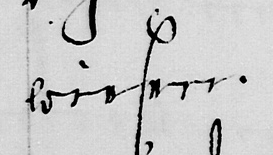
rwiesen.
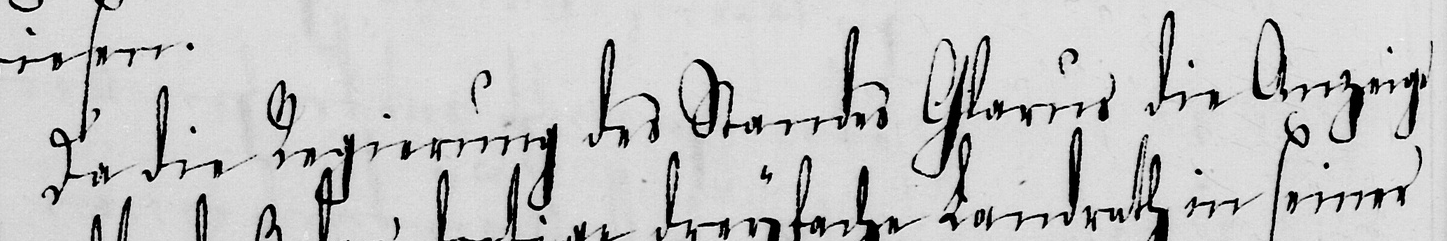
Da die Regierung des Standes Glarus die Anzeige
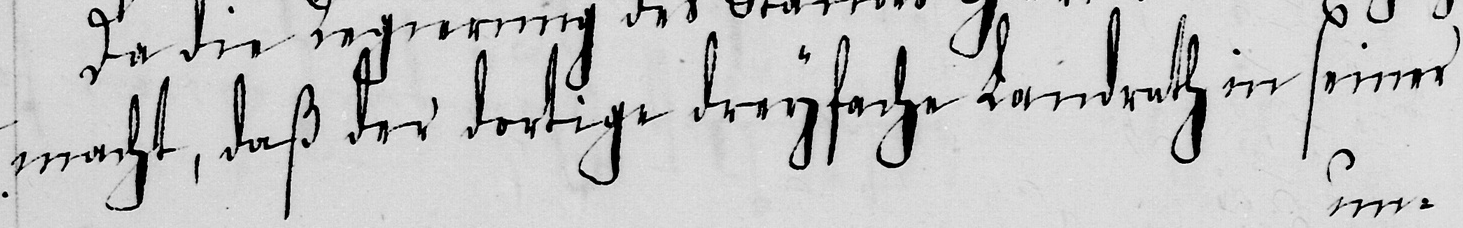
macht, daß der dortige dreyfache Landrath in seiner
